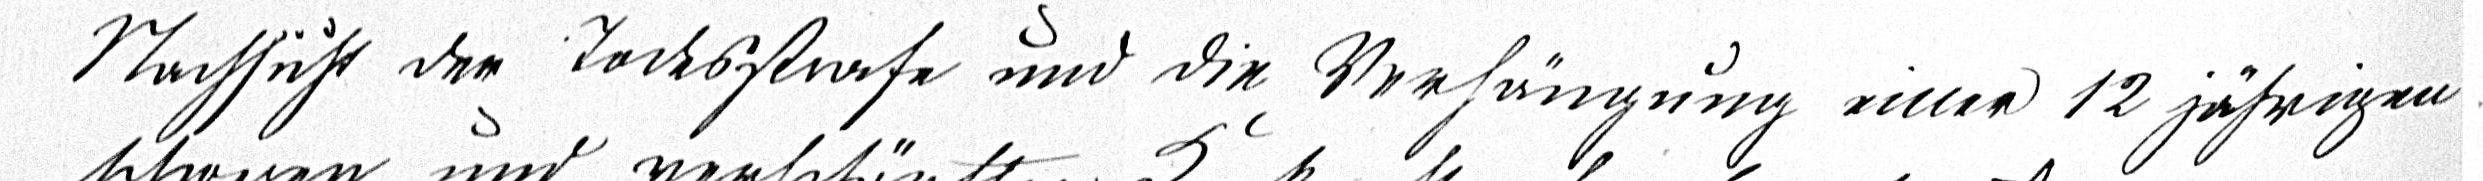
Nachsicht der Todesstrafe und die Verhängung einer 12 jährigen
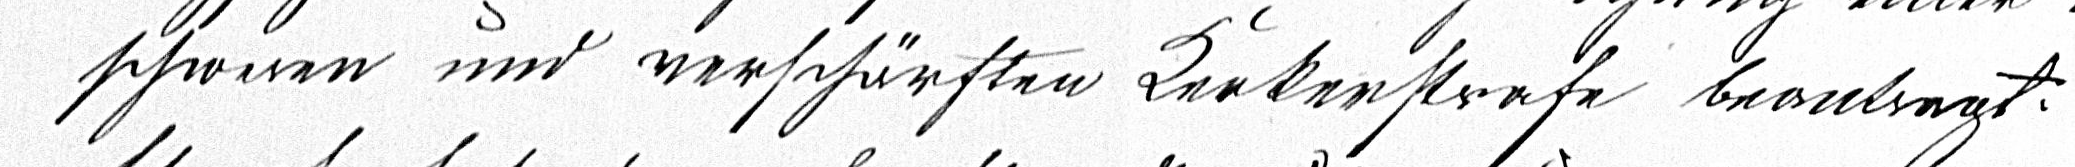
schweren und verschärften Kerkerstrafe beantragt.
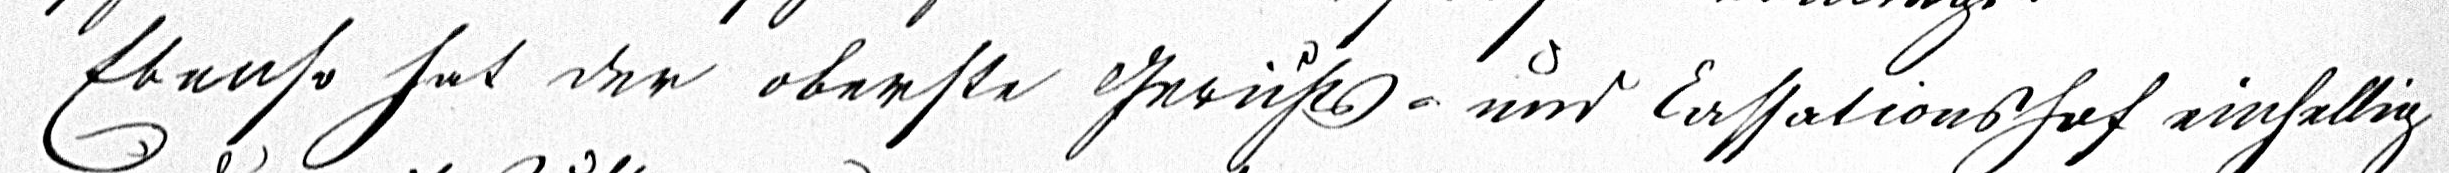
Ebenso hat der oberste Gerichts- und Cassationshof einhellig
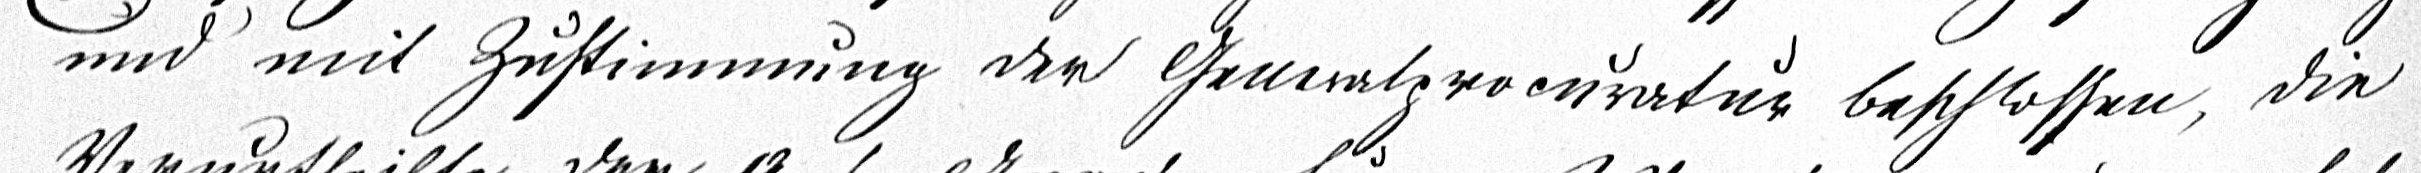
und mit Zustimmung der Generalprocuratur beschlossen, die
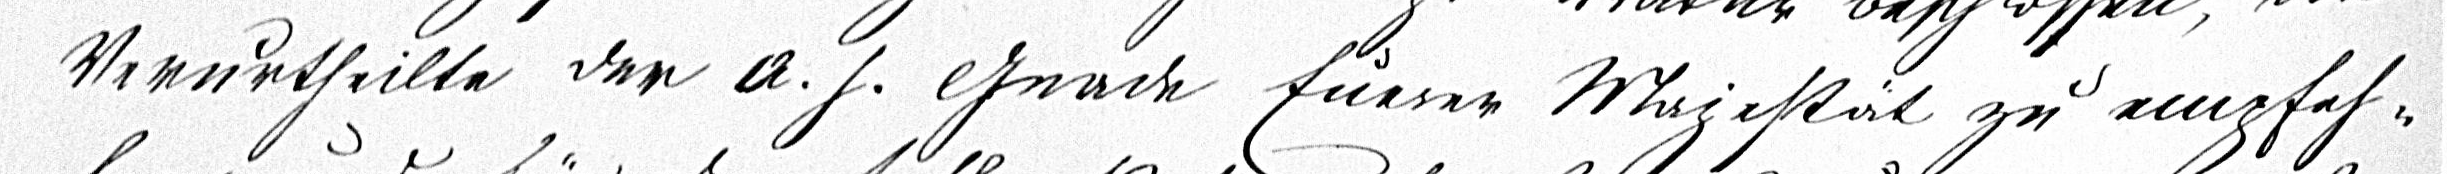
Verurtheilte der a.h. Gnade Euerer Majestät zu empfeh¬
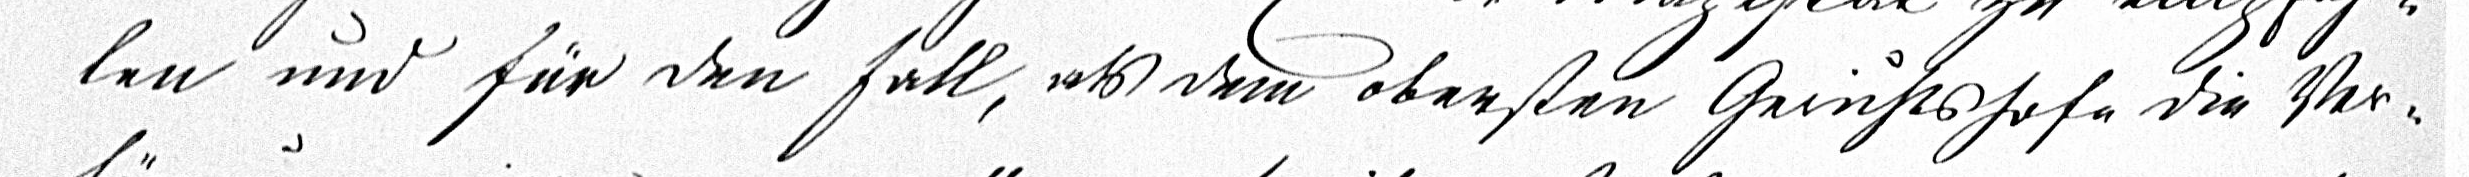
len und für den hFall, als dem obersten Gerichtshofe die Ver¬
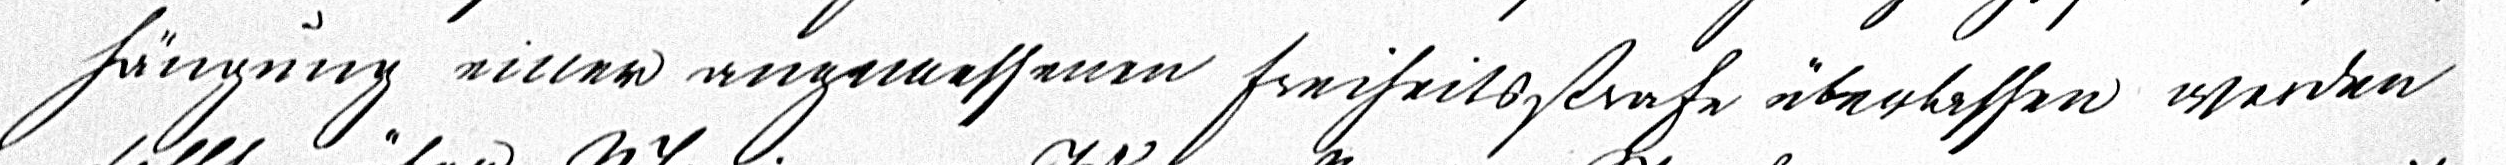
hängung einer angemessenen Freiheitsstrafe überlassen werden
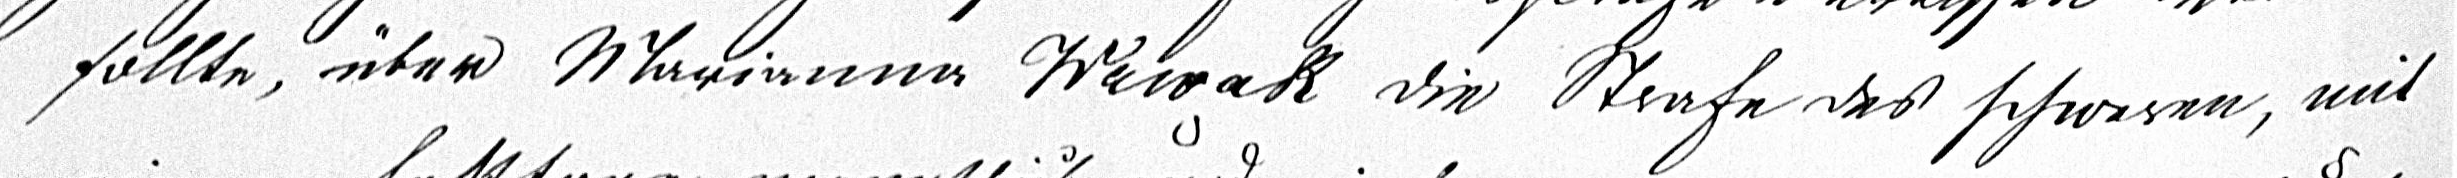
sollte, über Marianna Wawak die Strafe des schweren, mit
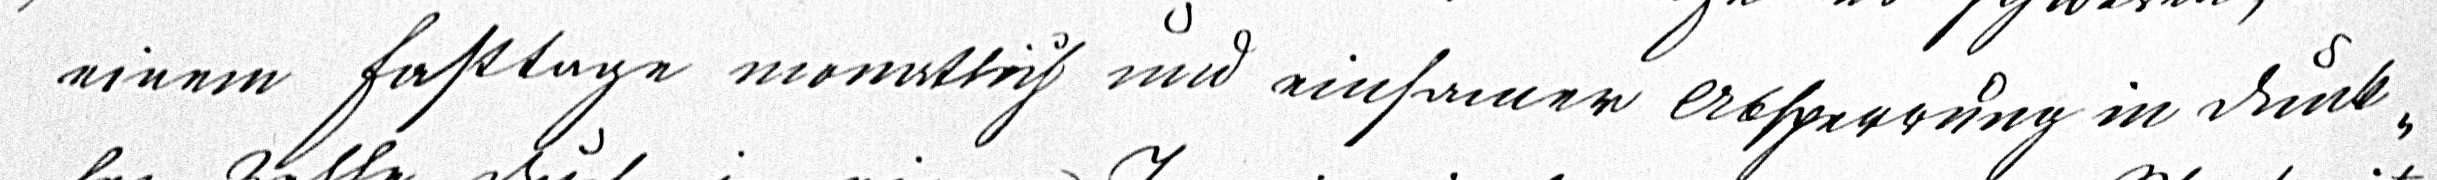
einem Fasttage monatlich und einsamer Absperrung in Dunk¬
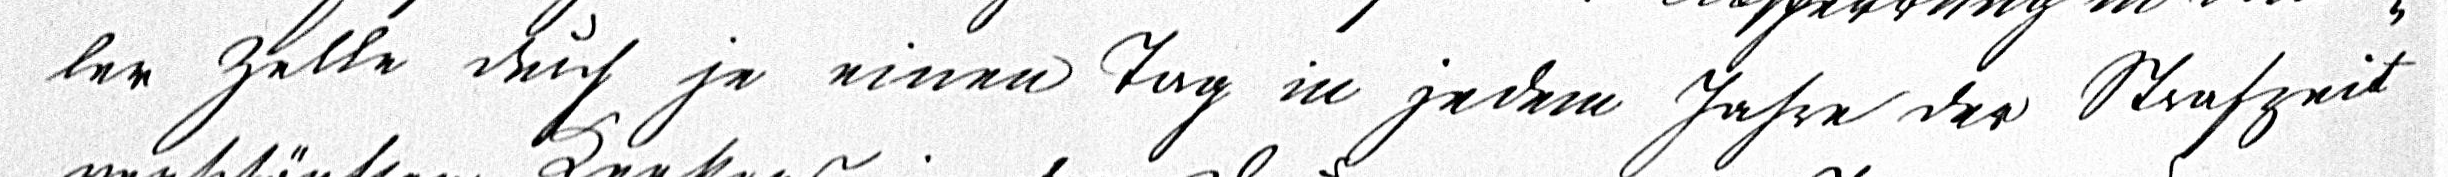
ler Zelle durch je einen Tag in jedem Jahre der Strafzeit
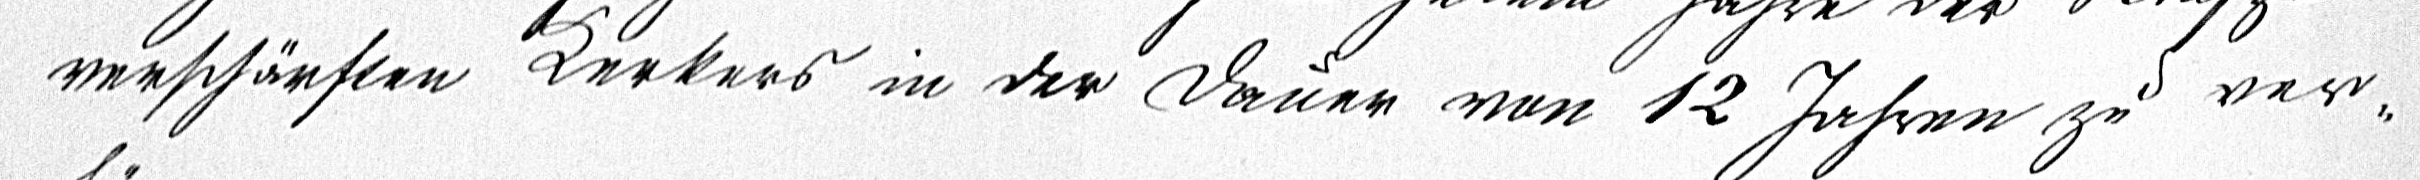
verschärften Kerkers in der Dauer von 12 Jahren zu ver¬
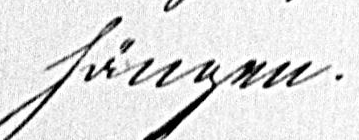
hängen.
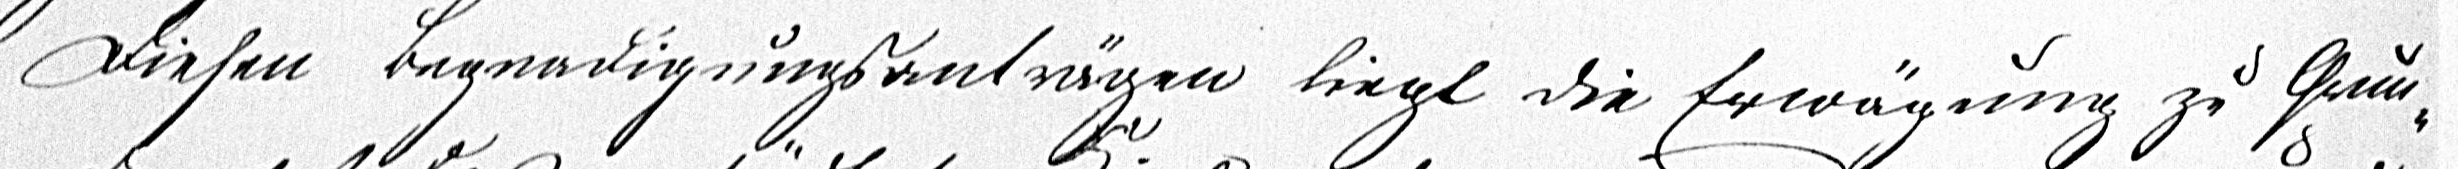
Diesen Begnadigungsanträgen liegt die Erwägung zu Grun¬
